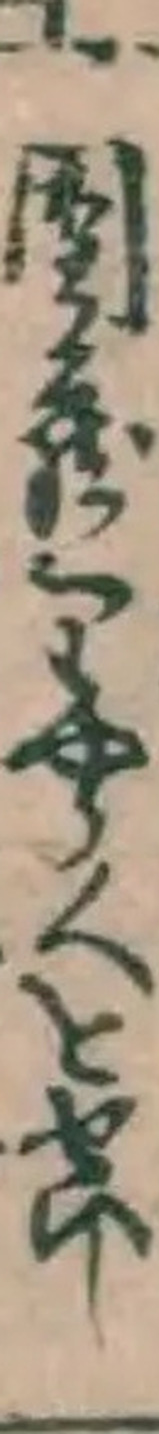團蔵りやう人をせいし
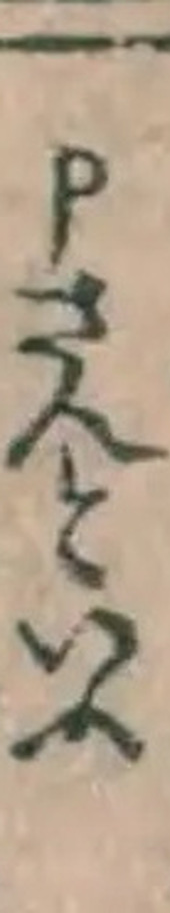申さんといふ
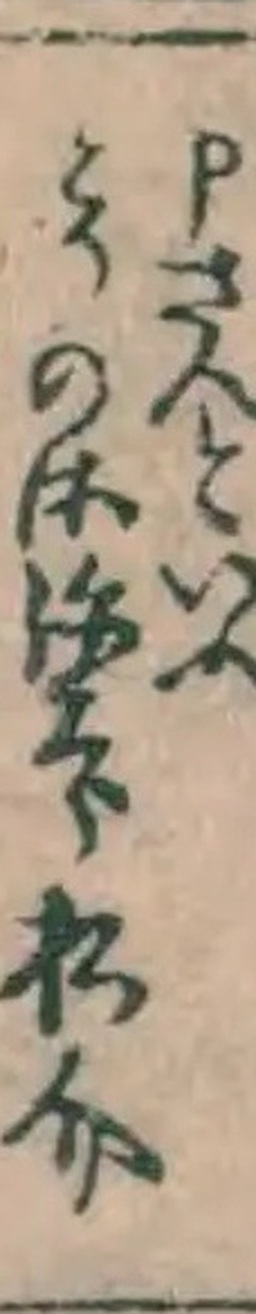とりの海弥三郎松介
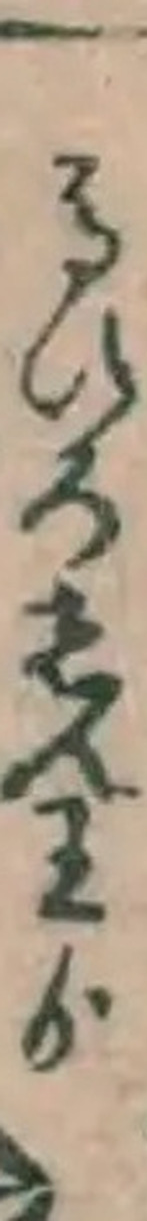高ひろしん王より
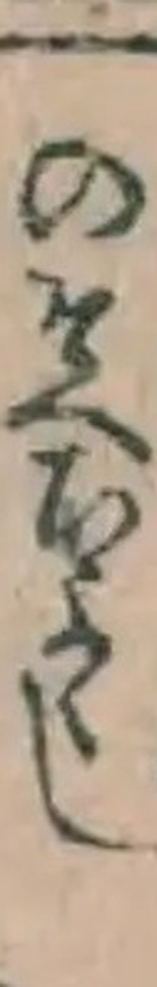のそへちよくし
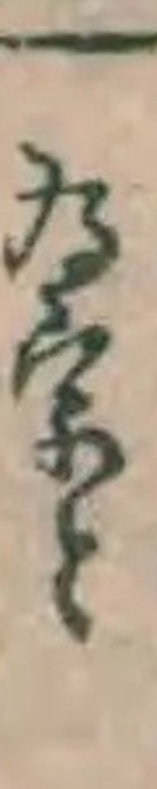為宗と
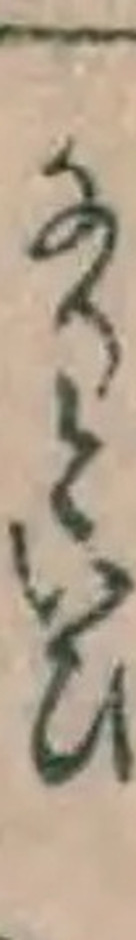なりといひ
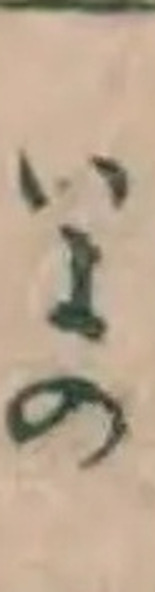いよの
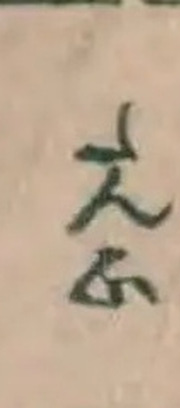たん正
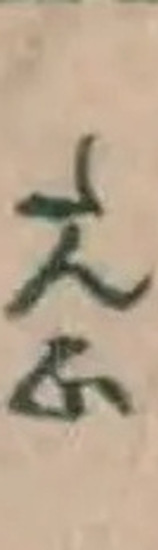たん正
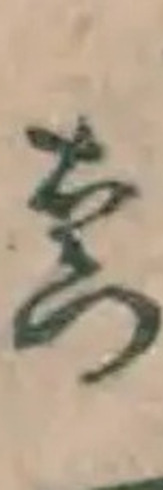左衛門

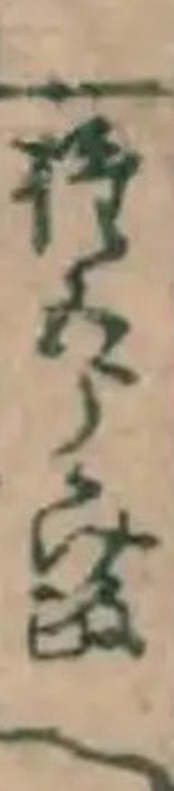権五郎かけ政
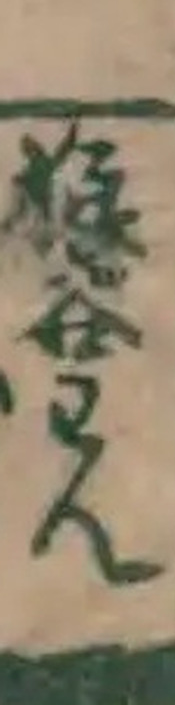狼谷わん
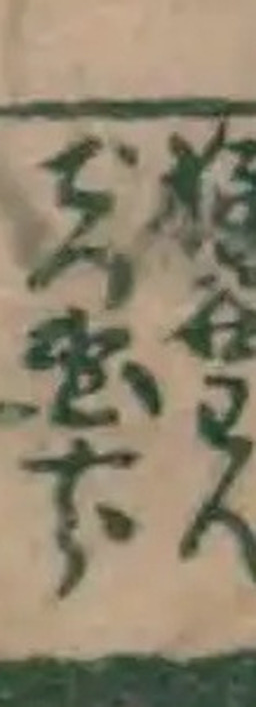てつ團十郎
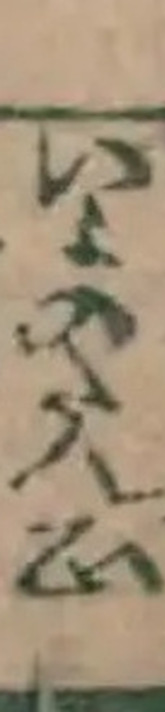いよのたん正
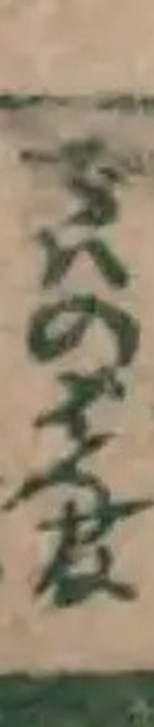ではのはん官
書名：伊達錦對将 : 森田座
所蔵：国立国会図書館 National Diet Library, JAPAN
